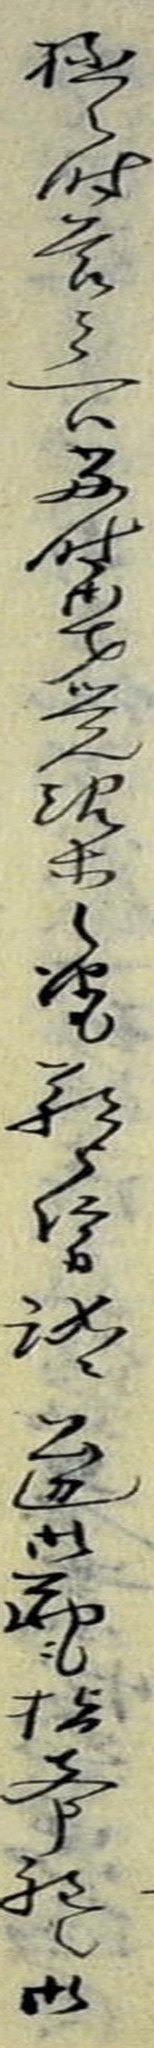極之時節に候へは当時御才覚銀等之儀も難被仰付誠に公辺御勤も指支申程之御
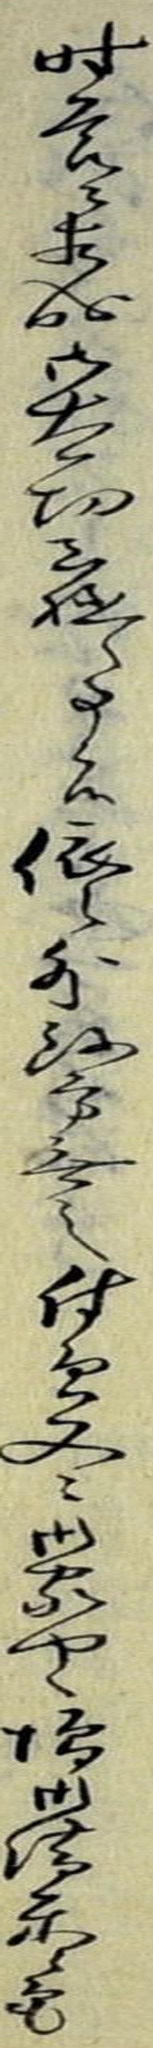時節に相成御太切至極之事に候依之外致方無之付而は又々御家中へ増御借米に而も
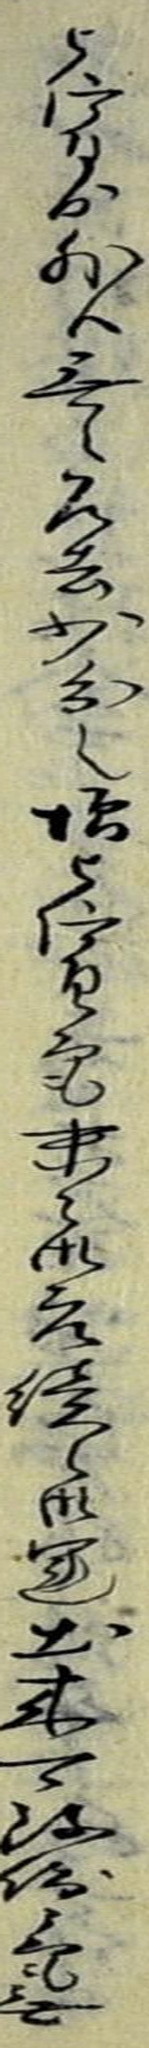被仰付ゟ外は無之乍去少分之増被仰付候而も末々御取続之運出来可致儀に而も無
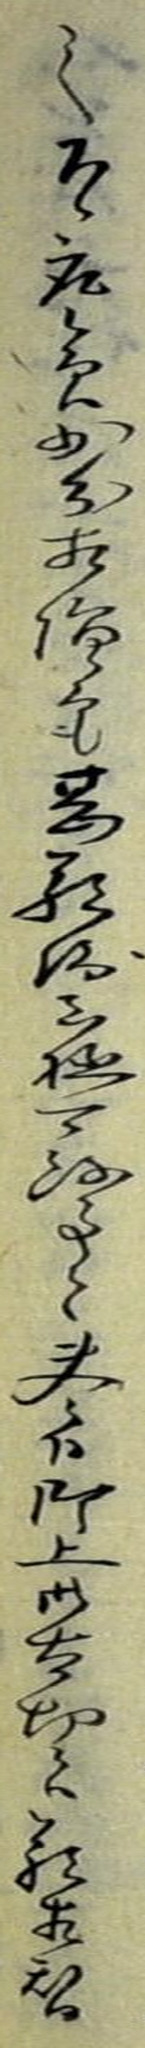之下取候而は少分相増候而も甚難儀至極可致事に候夫に付御上御太切には難相替
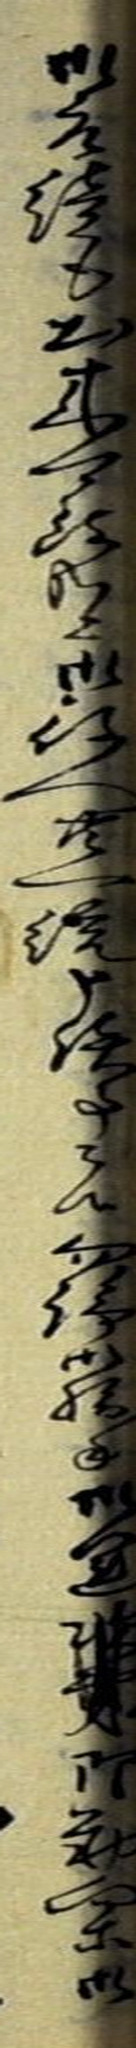御取続も出来可致哉と御役人共一統申談事に候勿論御勝手御運出来御勤向等御
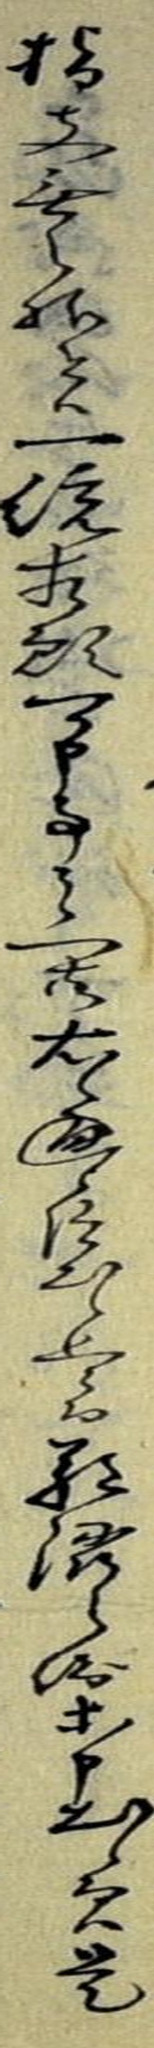指支無之様をは一統相願可申事に候へ共右之通被仰出候上に而難渋之儀等申出候而は是
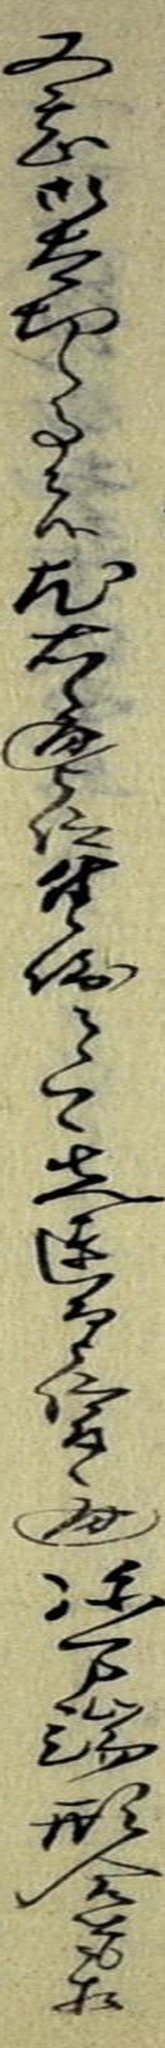又甚御太切之事に候尤右之通被仰付候儀に候はゝ先達而被仰付候通弥万端形合をも相
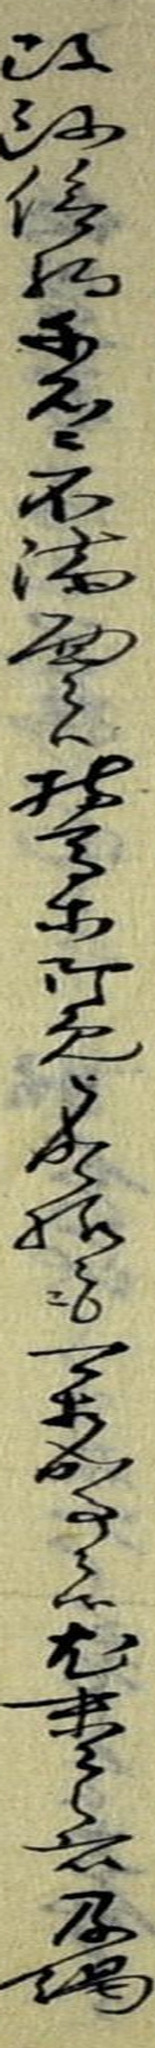改致倹約千石に不満面々は持馬等御免被成候様にも可相成事に候尤末々之者及渇
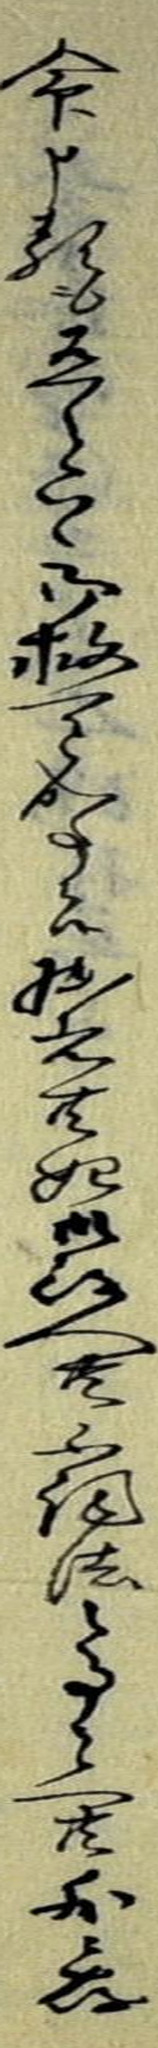命申類も有之候はゝ御救可被成事に候拙者共始御役人共不調法之事に候へ共外に存
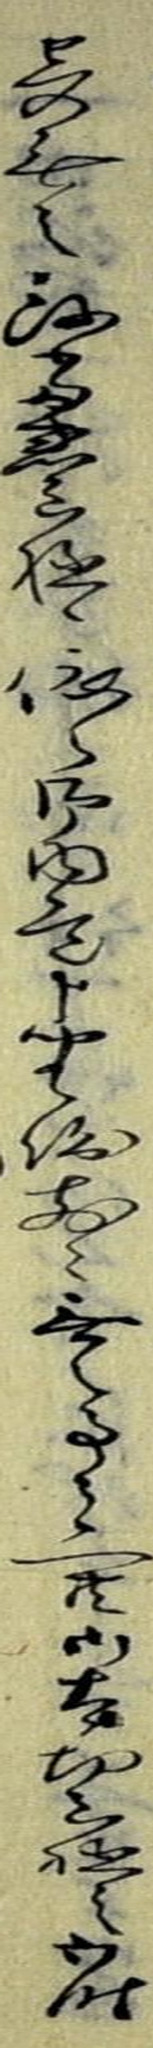寄無之致当惑至極候依之御内意申聞候儀前々無之事に候へ共御太切至極之御時
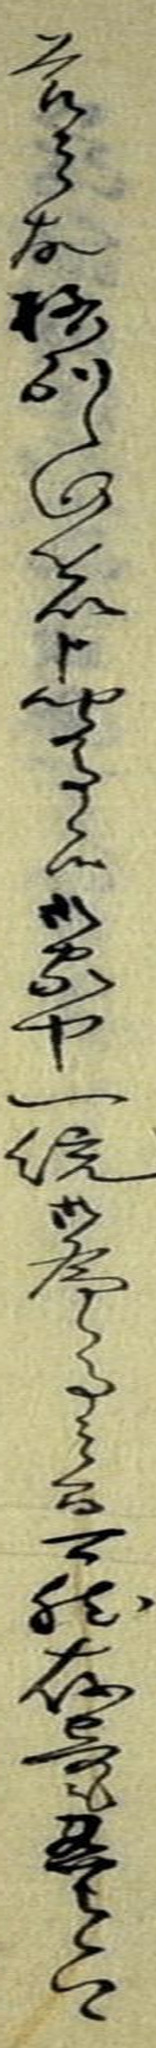節に候故格別之趣を以申聞事に候御家中一統御為之事に候間可然存寄も有之候はゝ
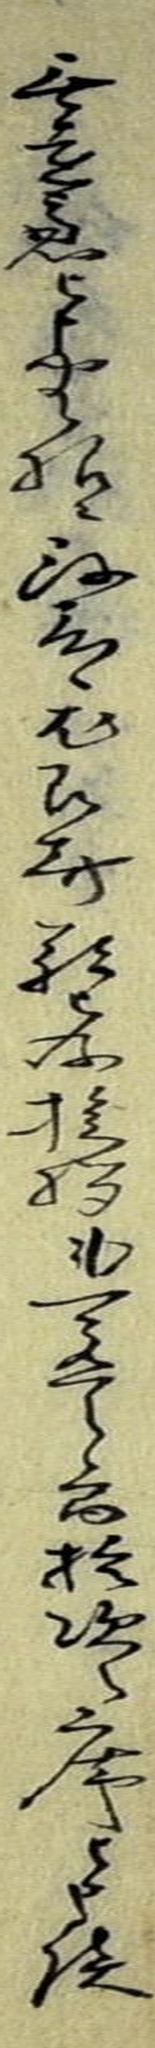無遠慮被申聞候様に致度候尤即刻難被及挨拶も可有之候間於次之席被申談
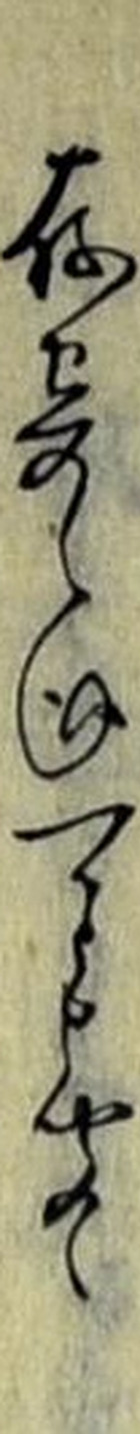存寄之趣可被申聞候
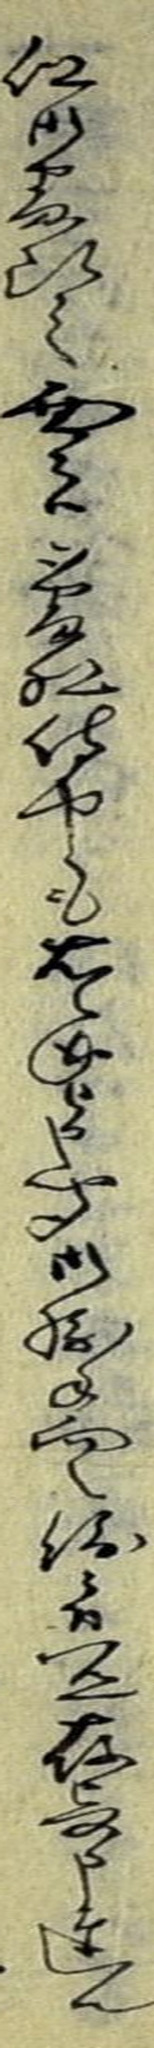但御番頭之面々は御番組侍中へも右之趣被申聞御勝手向之儀に付宜存寄申達候
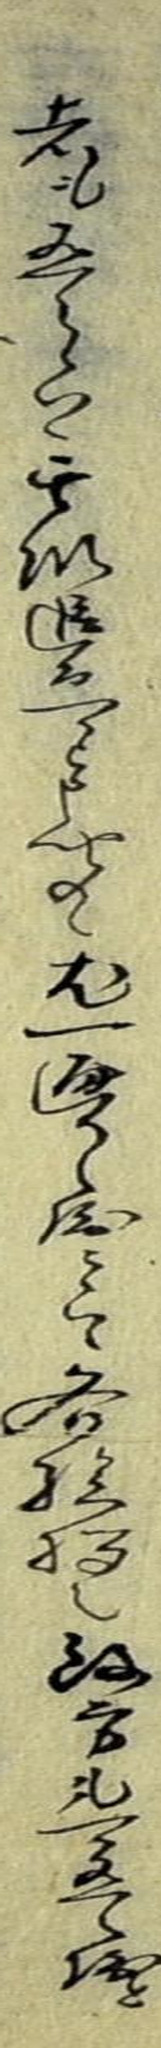者も有之候はゝ其段追而可被申聞候尤一通り之儀に候はゝ各挨拶之致方も可有之儀と
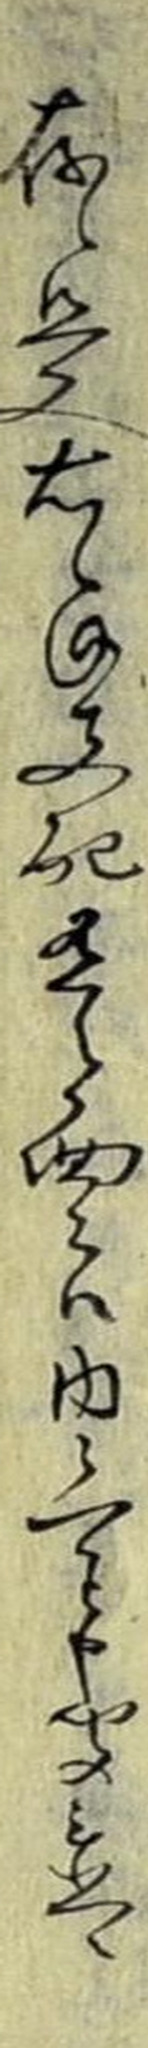存候且又右之趣支配有之面々は内々可被申聞置候
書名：命令之部 二
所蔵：福井県文書館 Fukui Prefectural Archives
